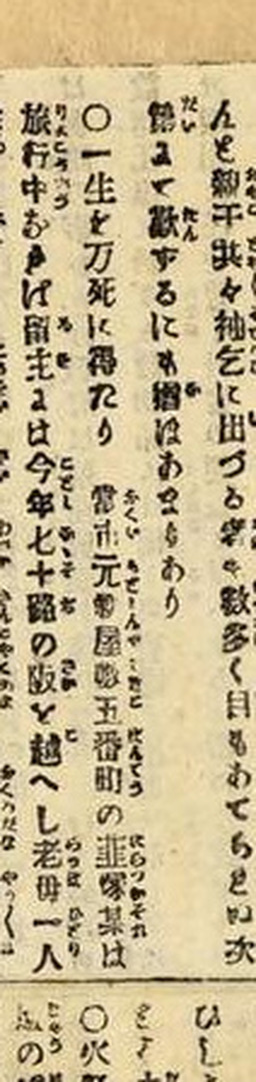○一生を万死に得たり當市元新屋敷五番町の韮塚某は
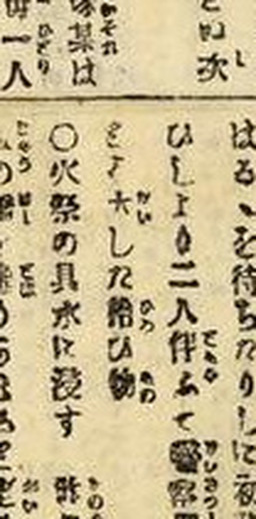とは大した拾ひ物
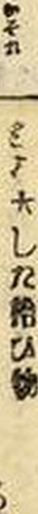とは大した拾ひ物
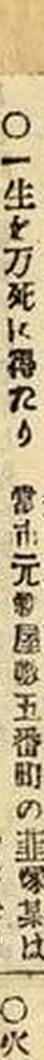○一生を万死に得たり當市元新屋敷五番町の韮塚某は
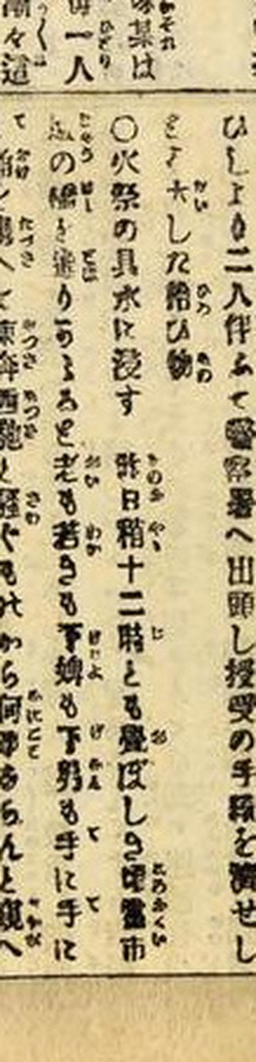○火祭の具水に浸す昨日稍十二時とも覺ぼしき頃當市
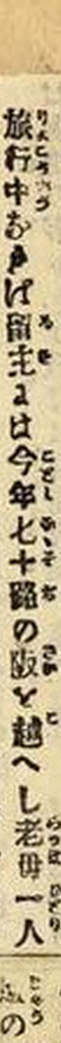旅行中なれば留主には今年七十路の阪を越へし老母一人
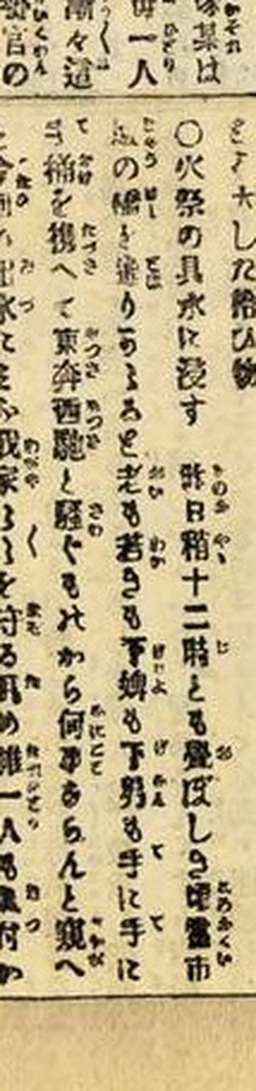城の橋を通りかゝると老も若きも下婢も下男も手に手に
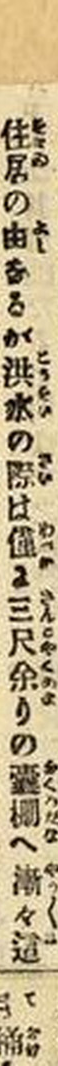住居の由なるが洪水の際は僅に三尺余りの囊棚へ漸々這
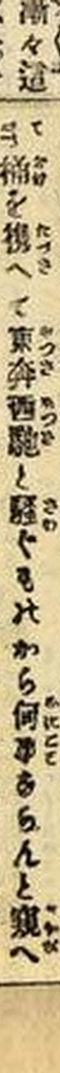手桶を携へて東奔西馳と騒ぐものから何事ならんと窺へ
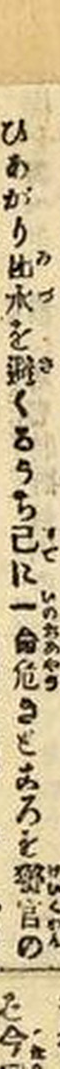ひあがり出水を避くるうち已に一命危きところを警官の
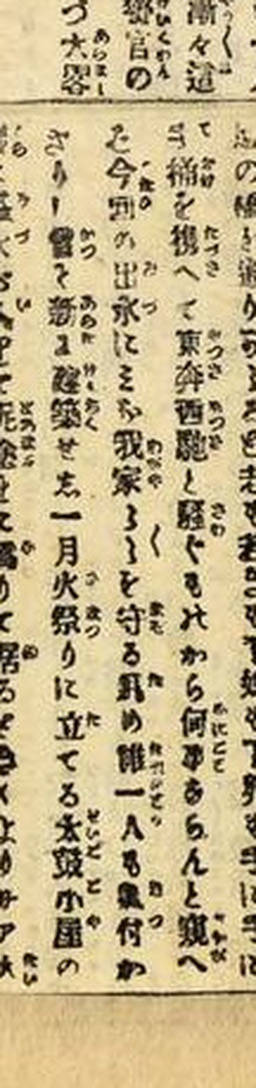ば今回の出水にみな我家々々を守る爲め誰一人も氣付か
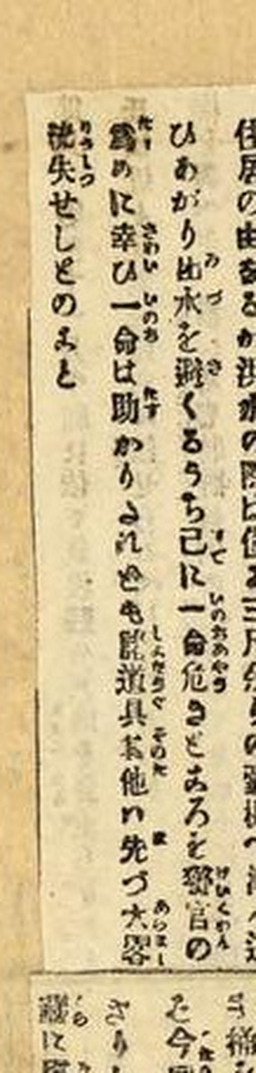爲めに幸ひ一命は助かりたれども諸道具其他は先づ大畧
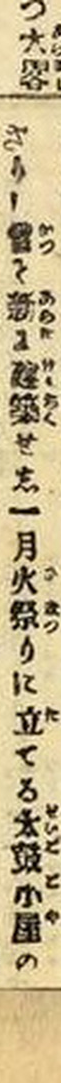ざりし嘗て新に建築せし一月火祭りに立てる太鼓小屋の
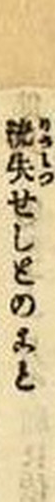流失せしとのこと
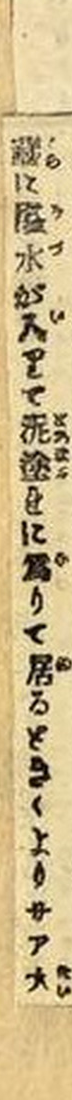藏に溢水が入りて泥塗れに爲りて居るときくよりサア大

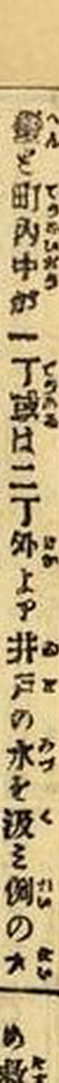變と町内中が一丁或は二丁外より井戸の水を汲み例の太
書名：温古集 五巻
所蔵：福井県文書館 Fukui Prefectural Archives
